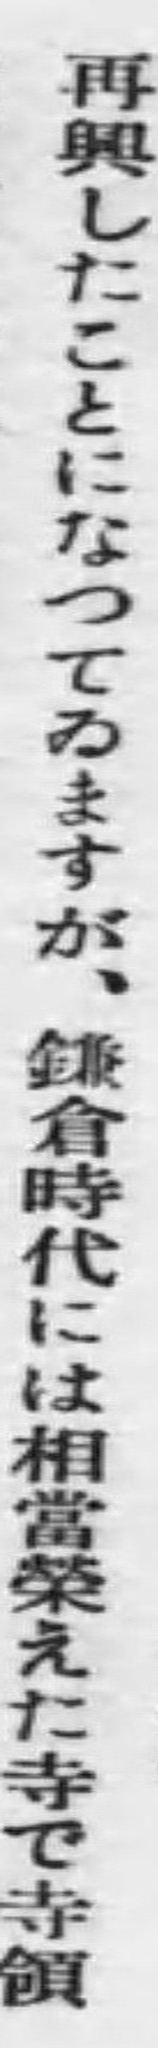再興したことになつてゐますが、鎌倉時代には相当栄えた寺で寺領
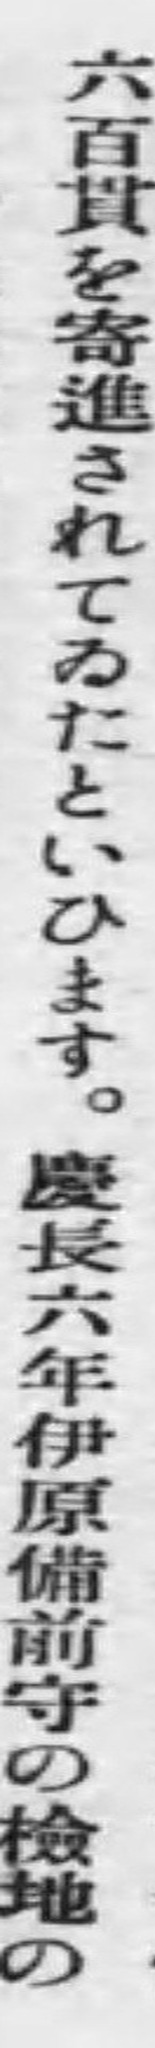六百貫を寄進されてゐたといひます。慶長六年伊原備前守の検地の
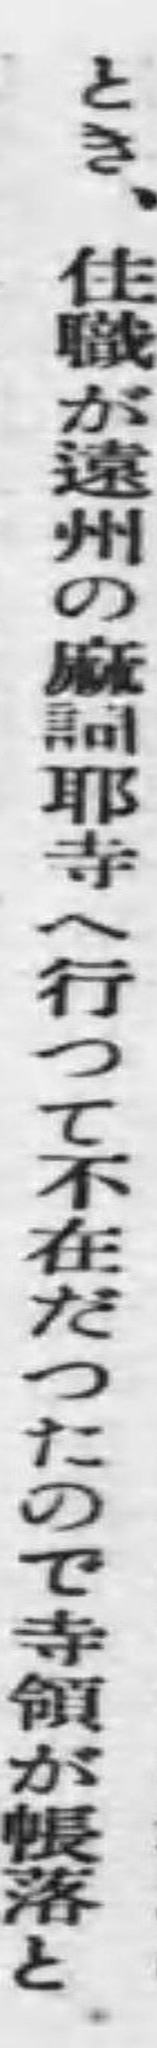とき、住職が遠州の麻訶耶寺へ行つて不在だつたので寺領が帳落と
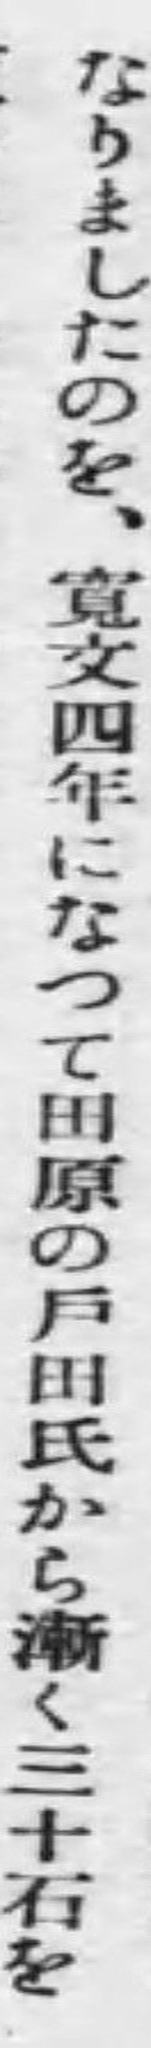なりましたのを、寛文四年になつて田原の戸田氏から漸く三十石を
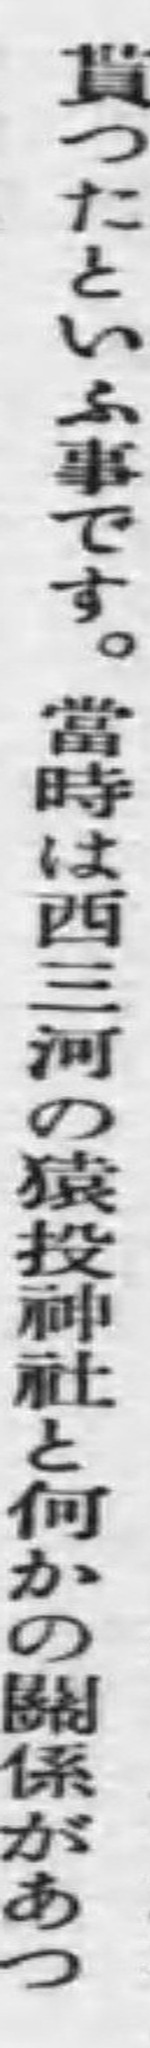貰つたといふ事です。当時は西三河の猿投神社と何かの関係があつ
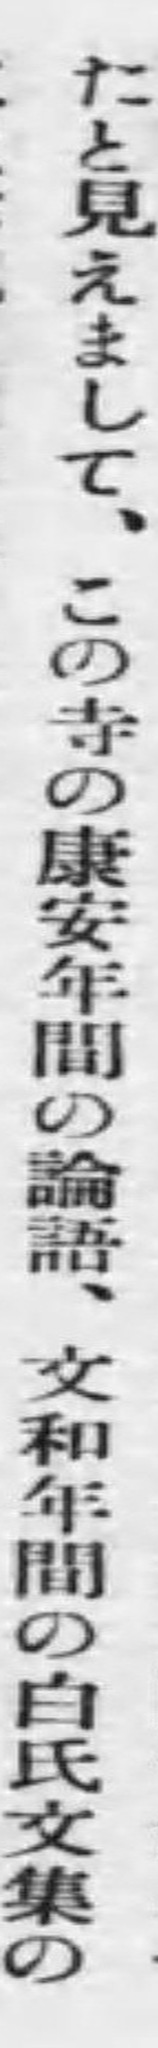たと見えまして、この寺の康安年間の論語、文和年間の白氏文集の
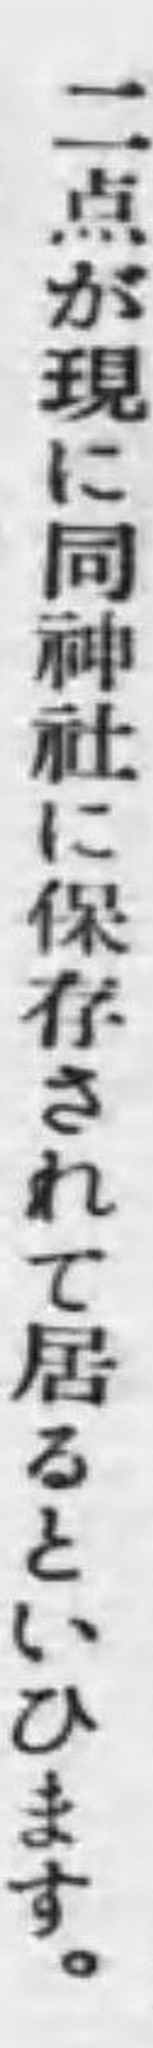二点が現に同神社に保存されて居るといひます。
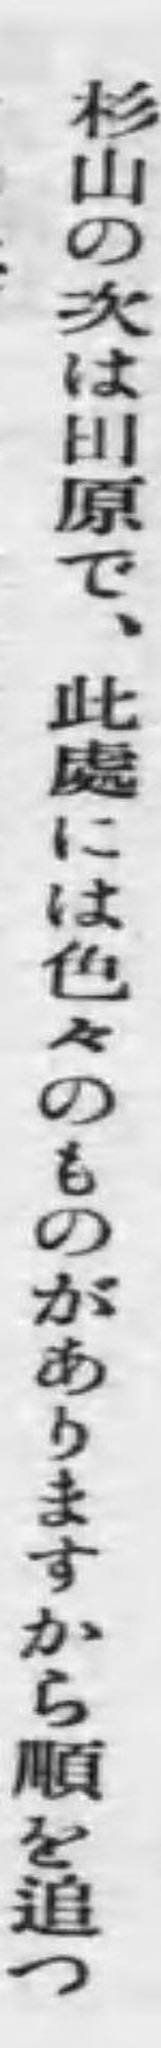杉山の次は田原で、此処には色々のものがありますから順を追つ
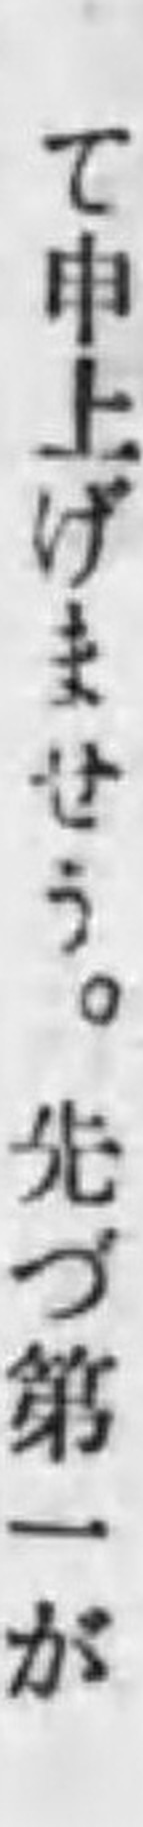て申上げませう。先づ第一が
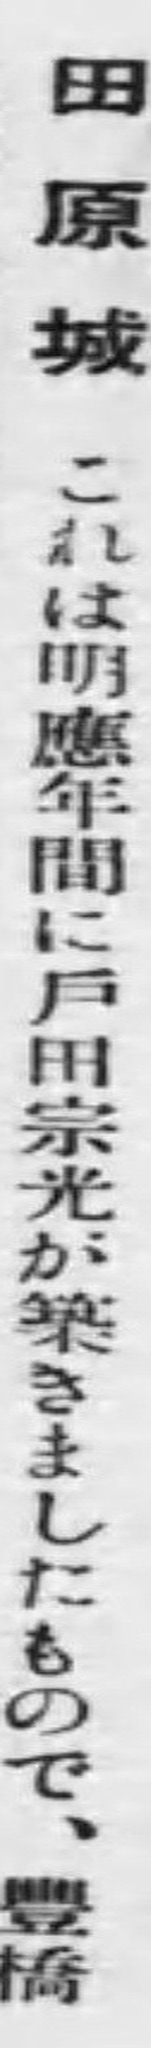田原城これは明応年間に戸田宗光が築きましたもので、豊橋
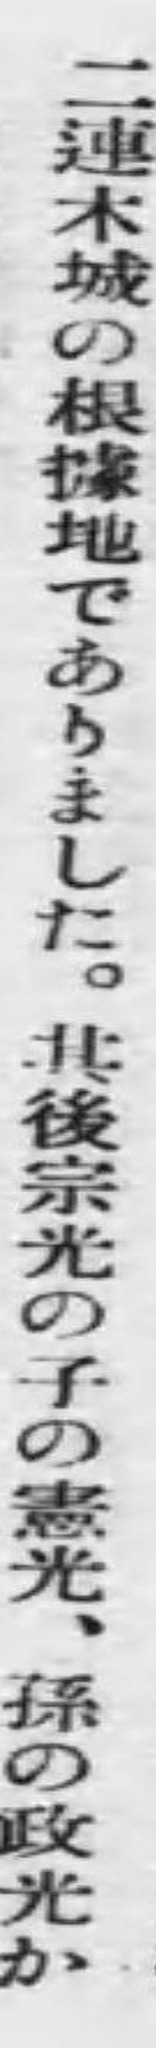二連木城の根拠地でありました。其後宗光の子の憲光、孫の政光か
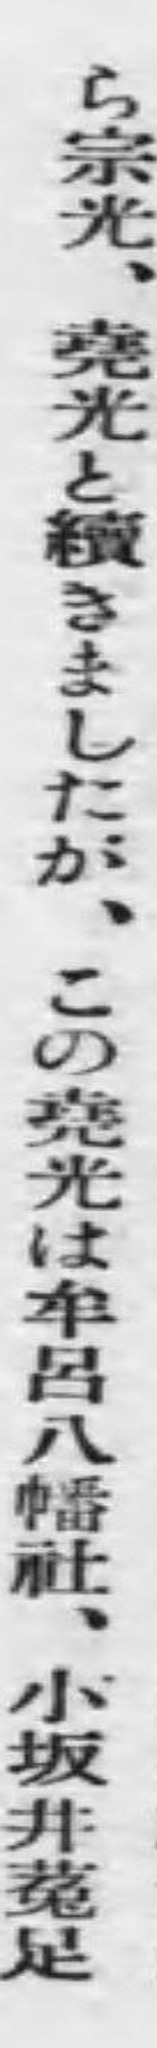ら宗光、尭光と続きましたが、この尭光は牟呂八幡社、小坂井菟足
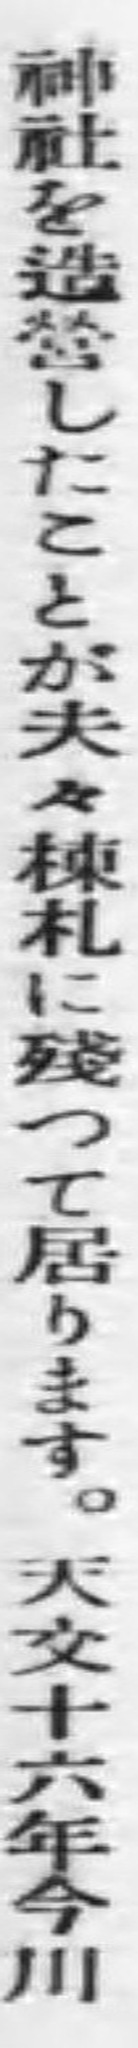神社を造営したことが夫々棟札に残つて居ります。天文十六年今川
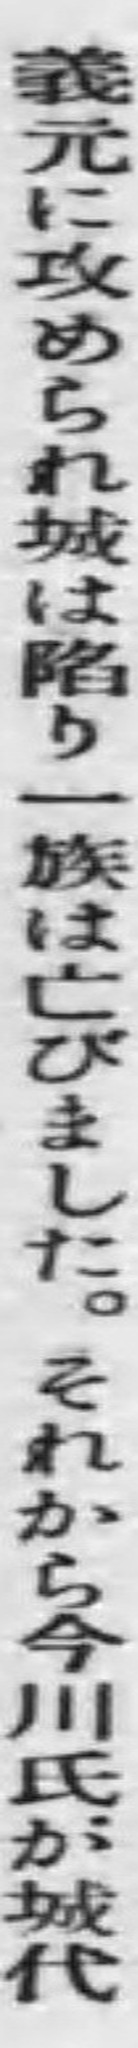義元に攻められ城は陥り一族は亡びました。それから今川氏が城代
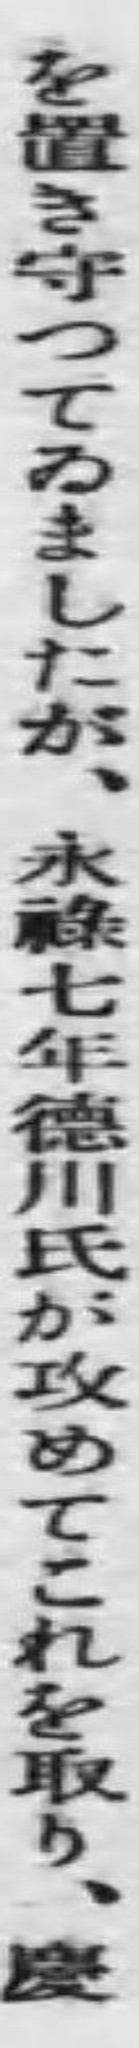を置き守つてゐましたが、永禄七年徳川氏が攻めてこれを取り、慶
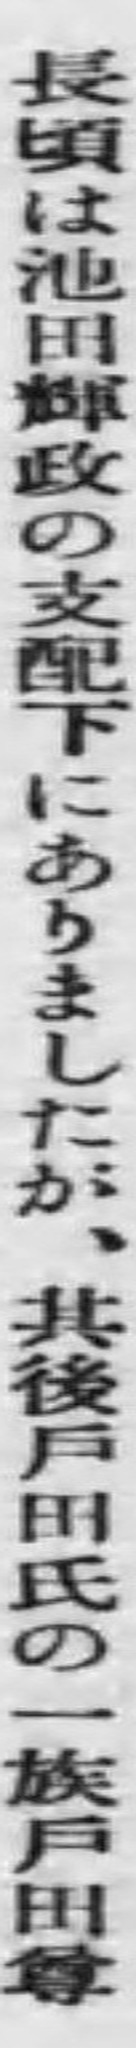長頃は池田輝政の支配下にありましたが、其後戸田氏の一族戸田尊
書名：東三河道中記 : 豊橋市及其附近案内
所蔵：国立国会図書館 National Diet Library, JAPAN
